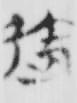御
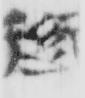○（就）
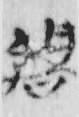嘉
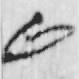㠯（以）
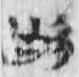○（廷）
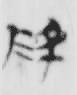阩
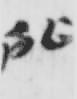門
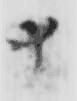又
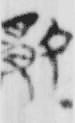敗
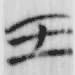王
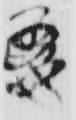婁
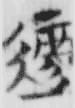逯
